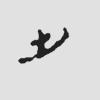土
